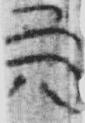而
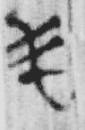民
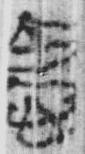愄（畏）
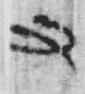又（有）
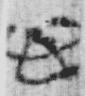心
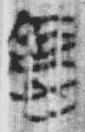愄（畏）
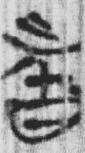者
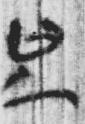也
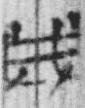戔（贱）
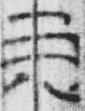而
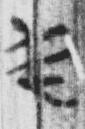民
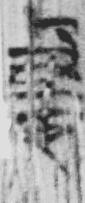貴
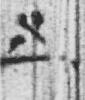之
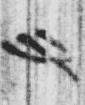又（有）
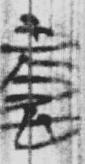惪（德）
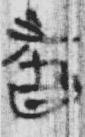者
